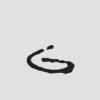㠯（以）
